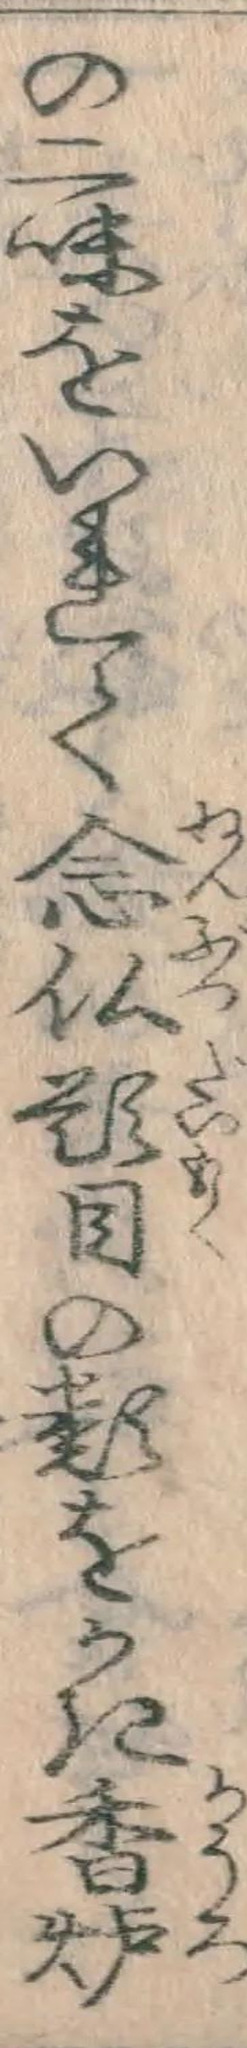の二味をいれて念仏題目の類をかき香炉
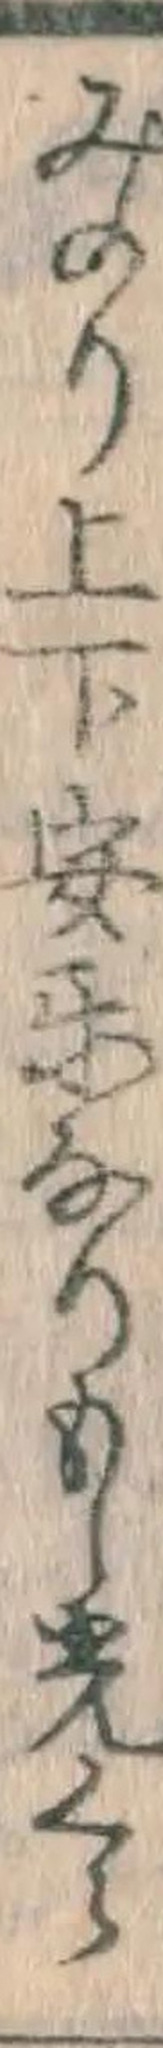みのり上下安楽なりもし光くら
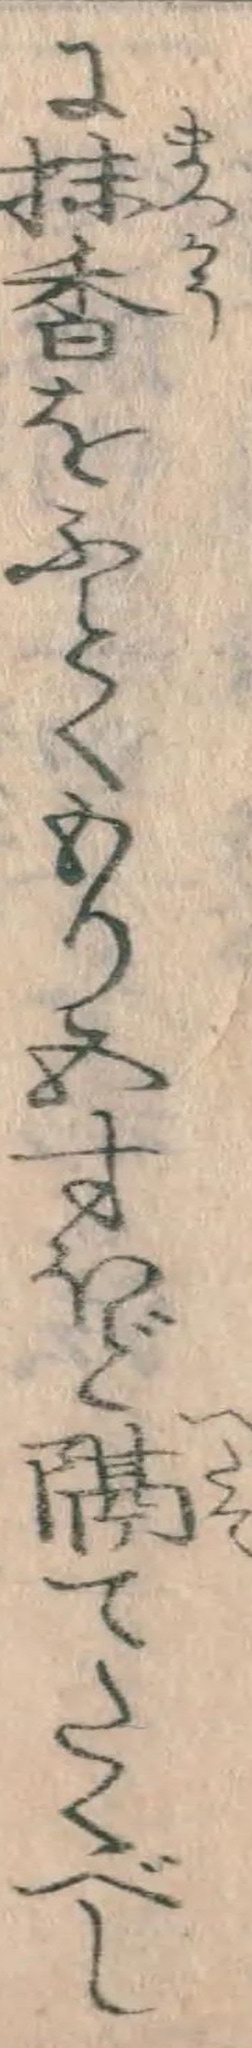に抹香をふとくもり五寸ほど隔てたくべし
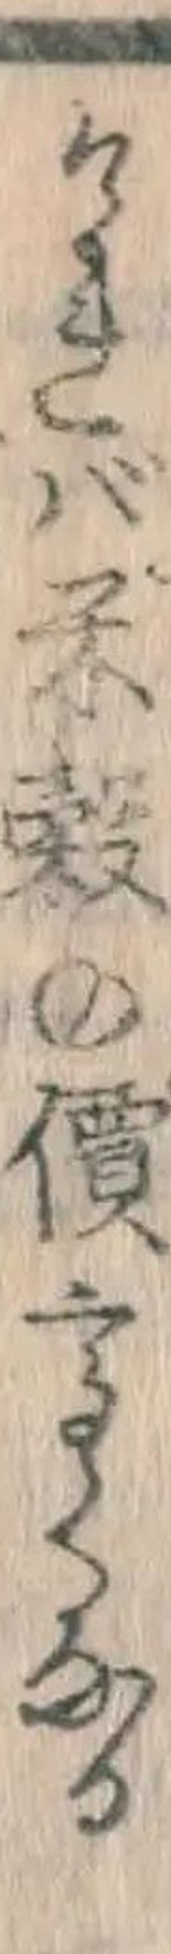ければ米穀の価高くなる
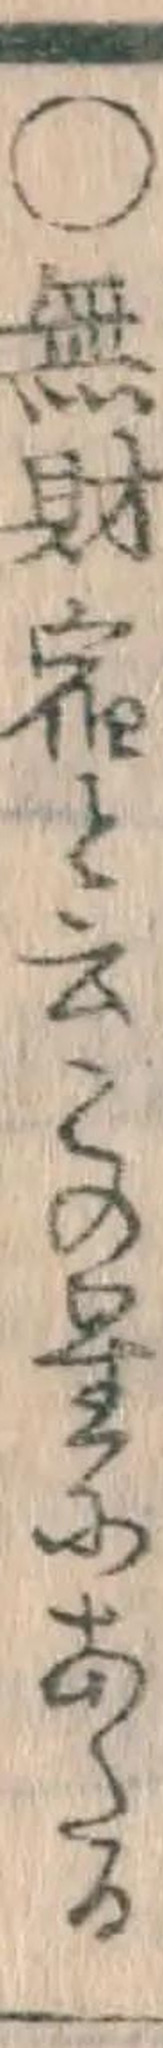○無財宿と云この星にあたる
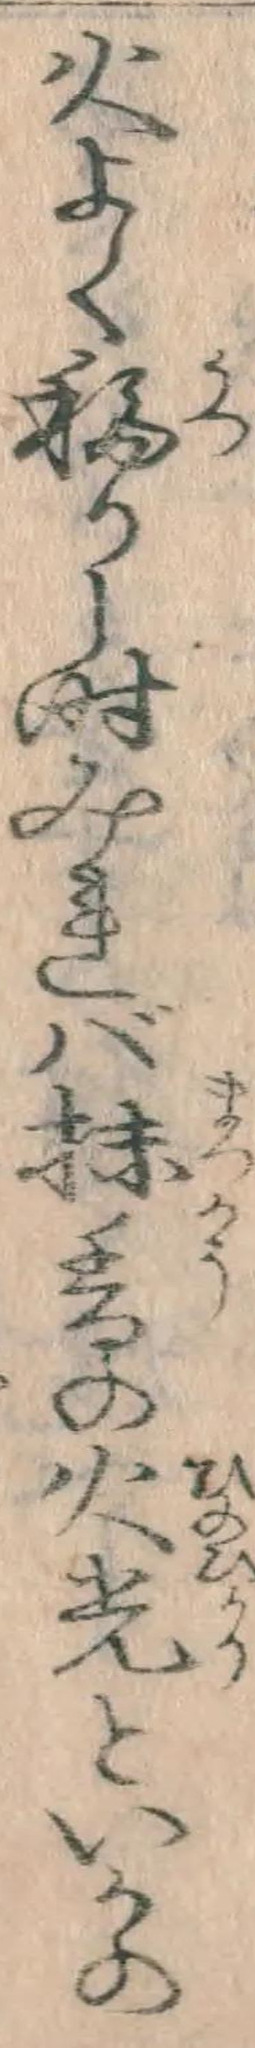火よく移りし時みれば抹香の火光といかの
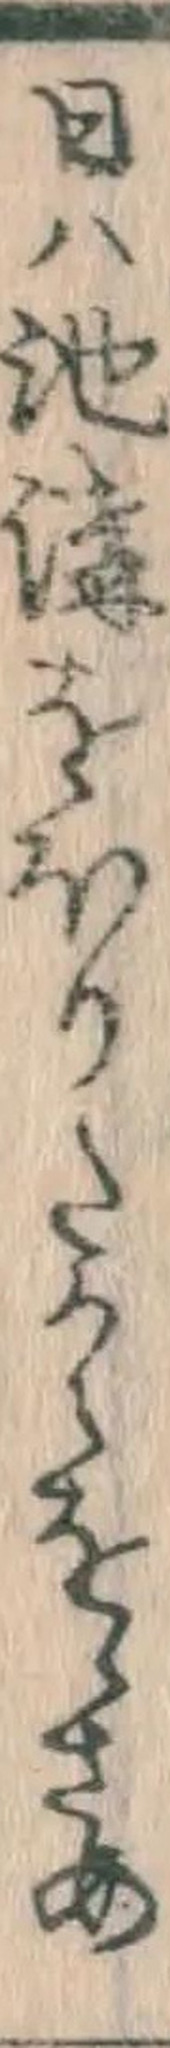日は池溝をほりたからをゝさめ
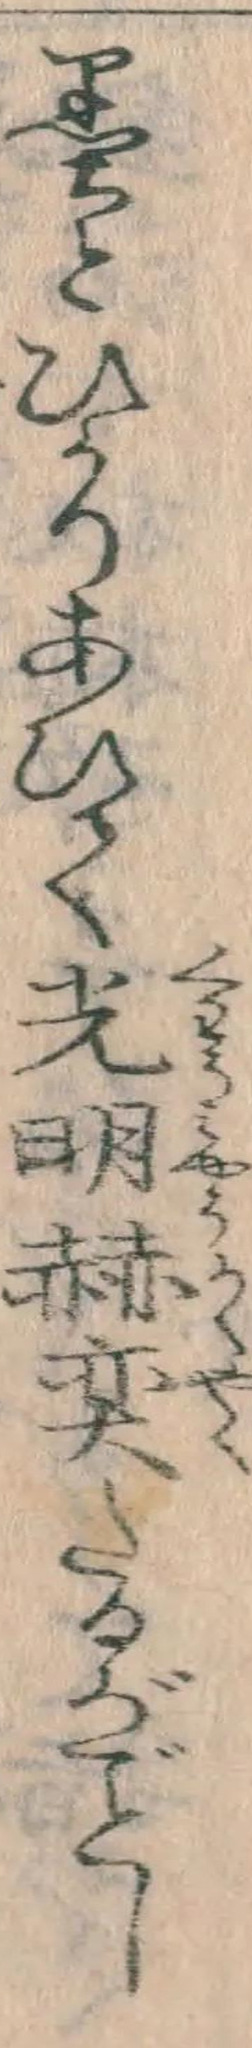墨とひかりあひて光明赫奕たるがごとし
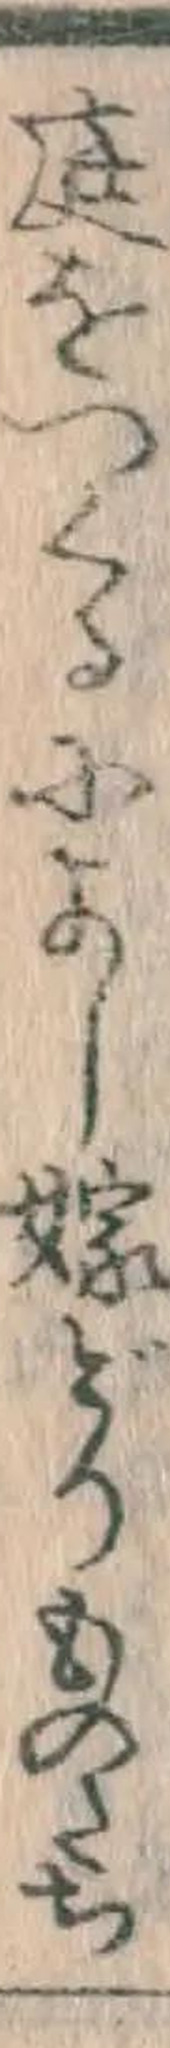庭をつくるによし嫁どりものたち
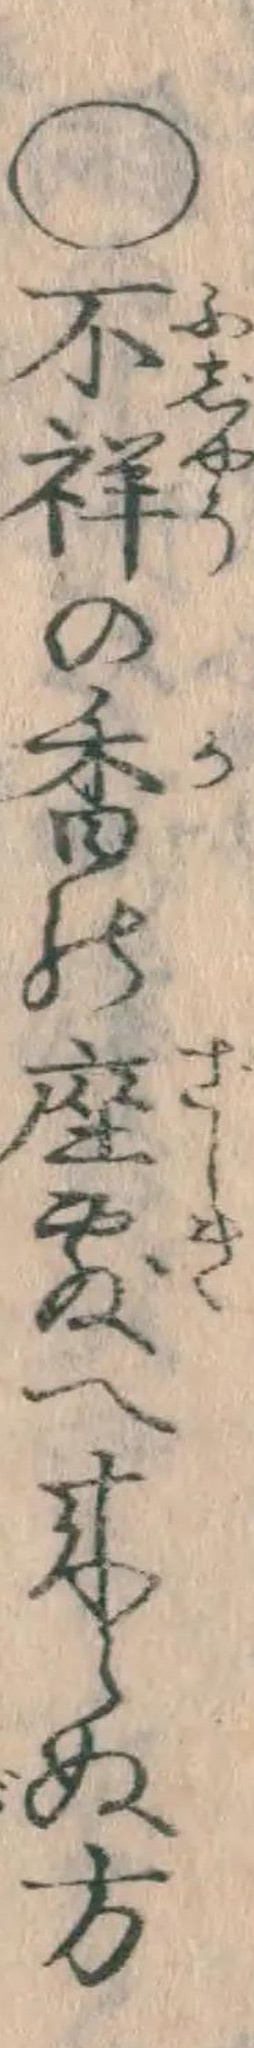○不祥の香の座敷へ来らぬ方
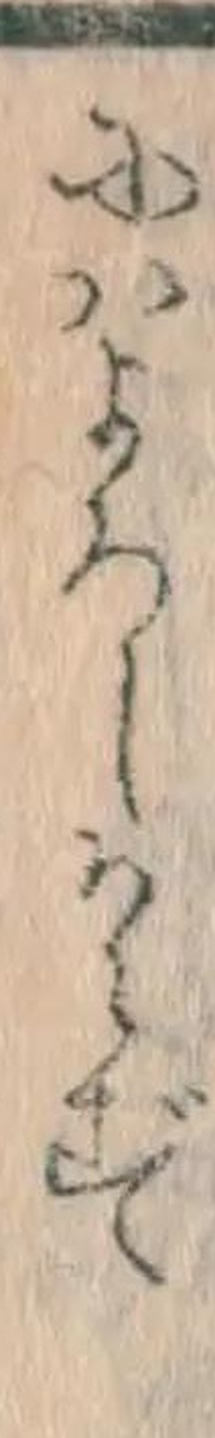にはよろしからず
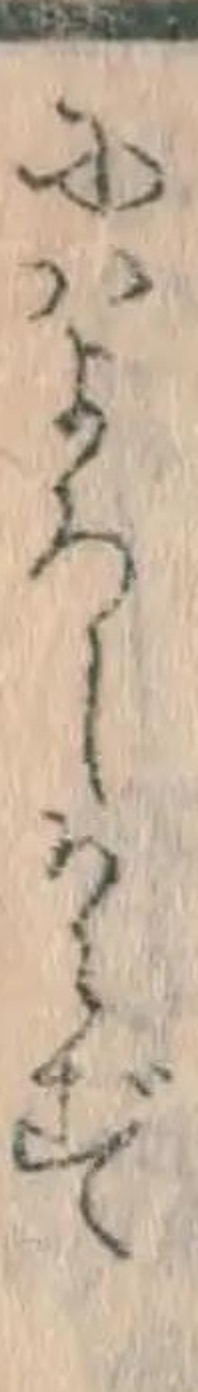にはよろしからず
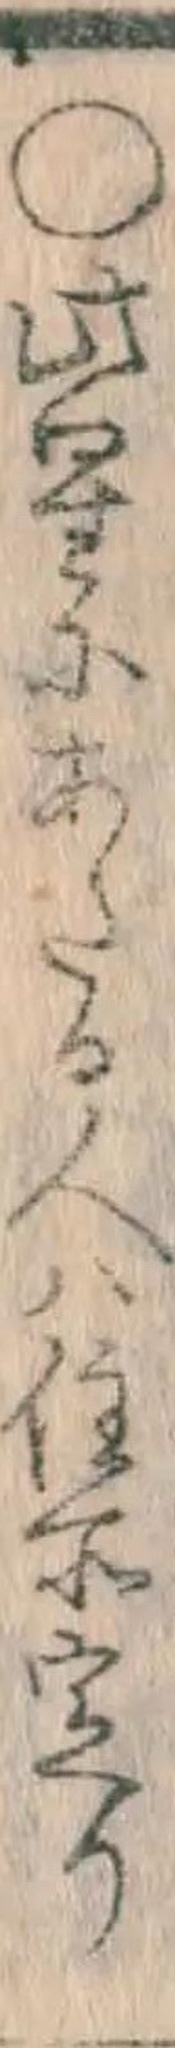○此星にあたる人は住所定り
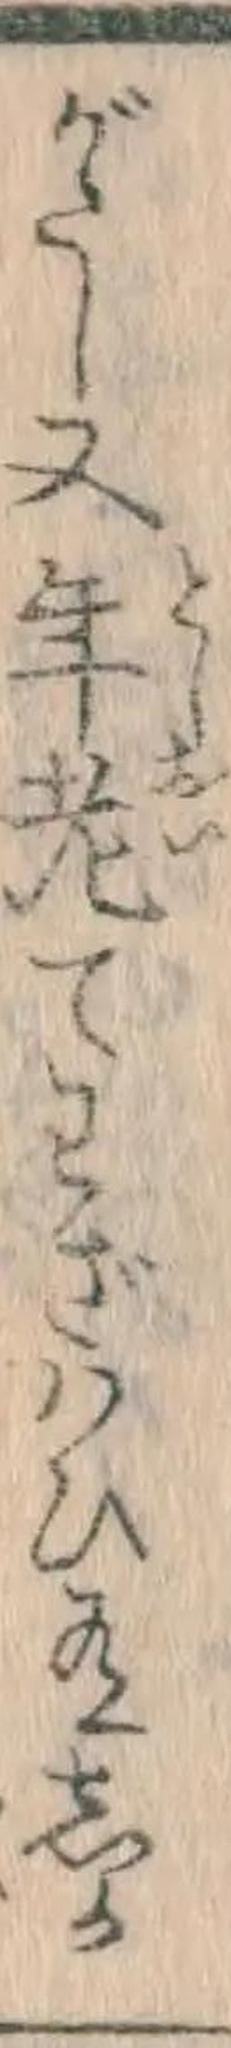がたし又年老てわざはひ有しか
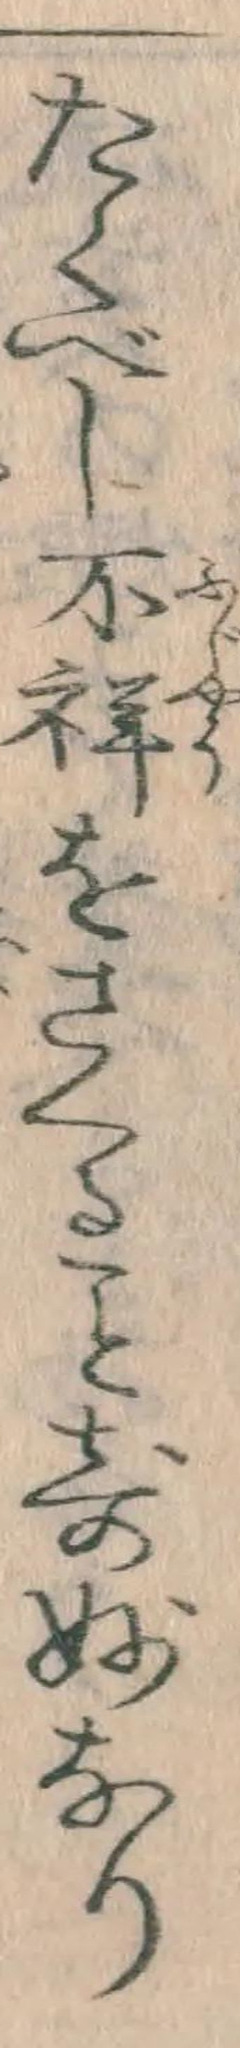たくべし不祥をさくること奇妙なり
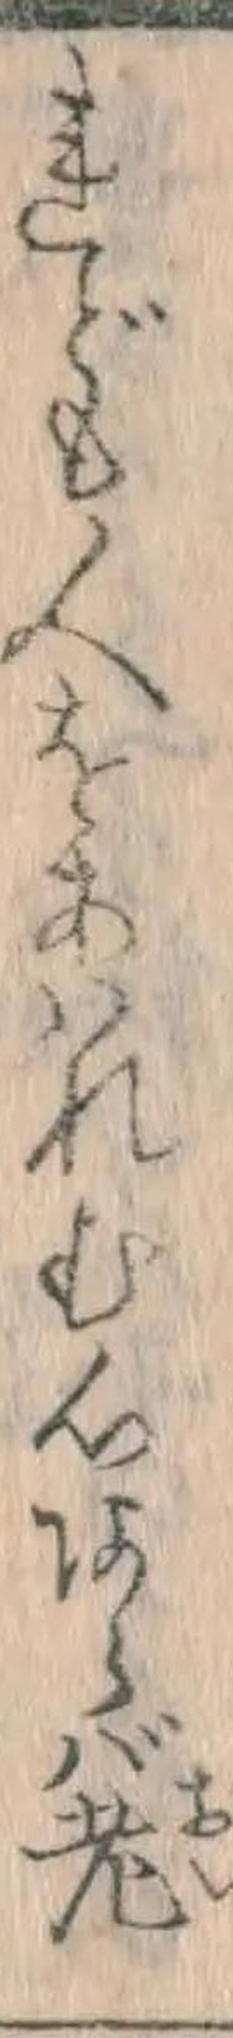れども人をあはれむ心あらば老
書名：広益秘事大全 3巻. [2]
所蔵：国立国会図書館 National Diet Library, JAPAN
